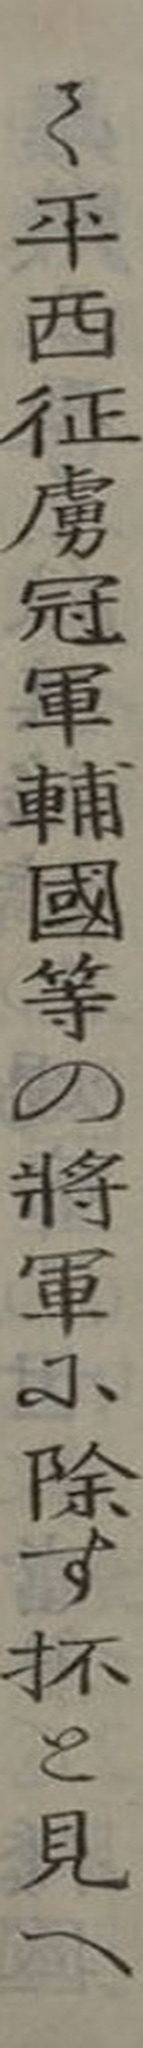て平西征虜冠軍輔國等の將軍に除す抔と見へ
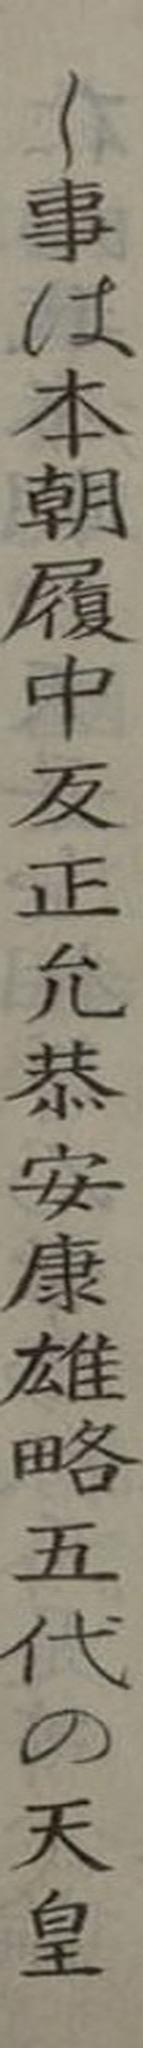し事は本朝履中反正允恭安康雄略五代の天皇
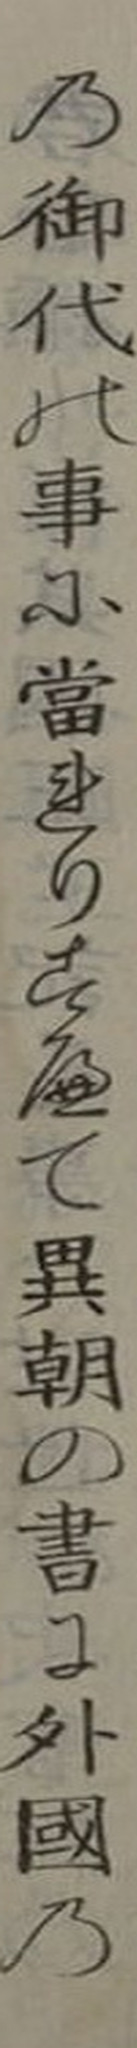の御代の事に當れりすへて異朝の書に外國の

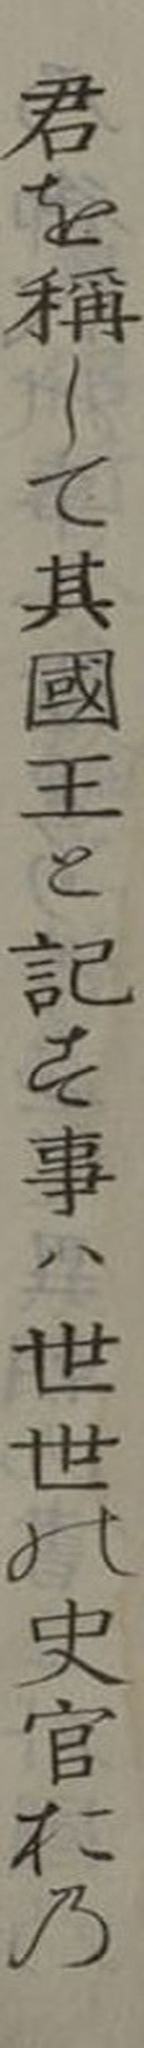君を稱して其國王と記す事ハ世世の史官おの
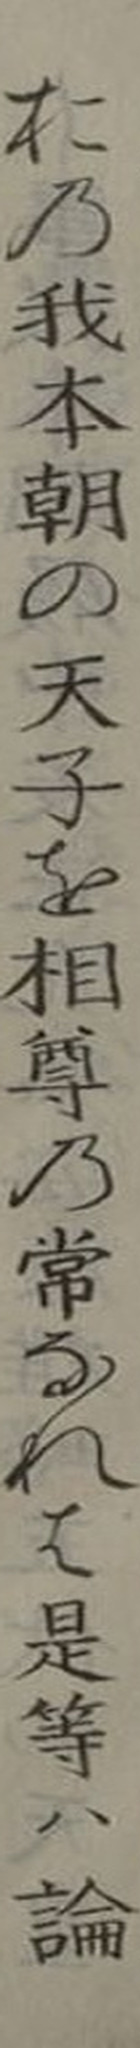おの我本朝の天子を相尊の常なれは是等ハ論
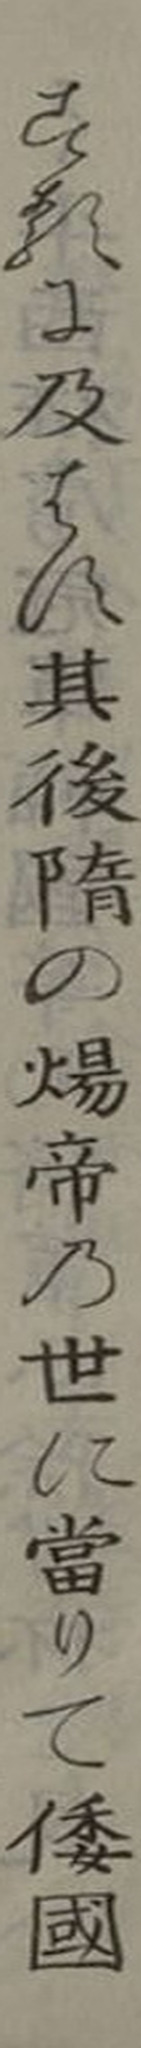するに及はす其後隋の場帝の世に當りて倭國
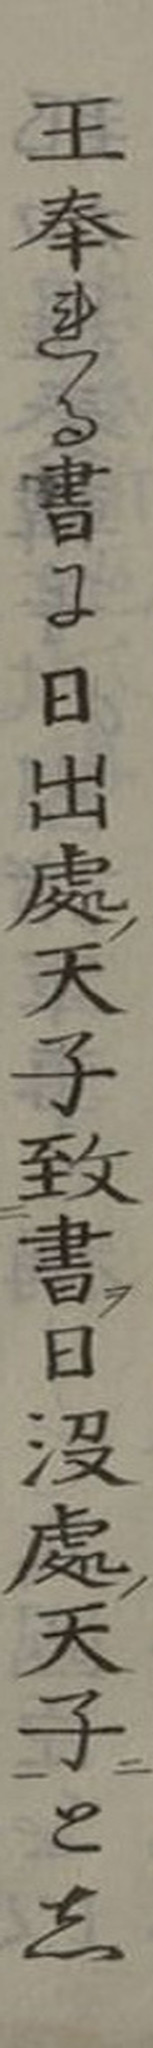王奉れる書に日出處天子致書日沒處天子とし
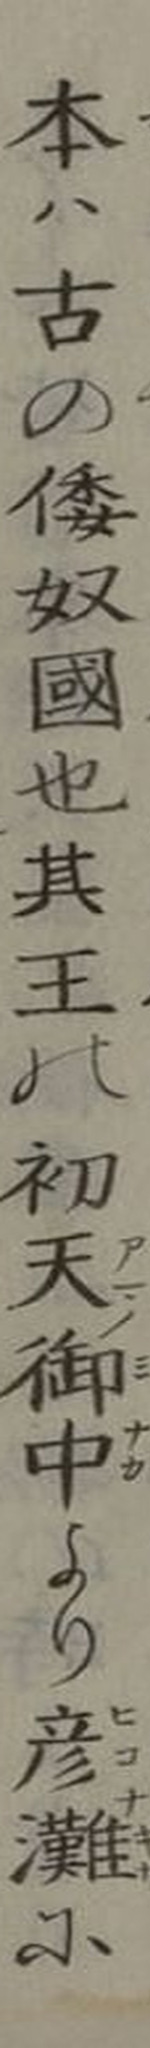本ハ古の倭奴國也其王の初天御中ヨリ彦灘に
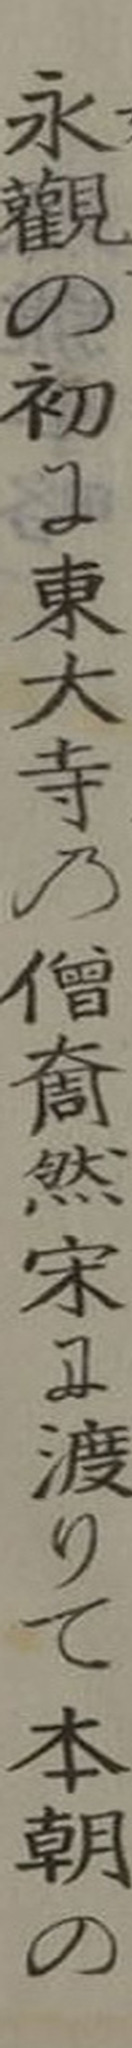永觀の初に東大寺の僧奝然宋に渡りて本朝の
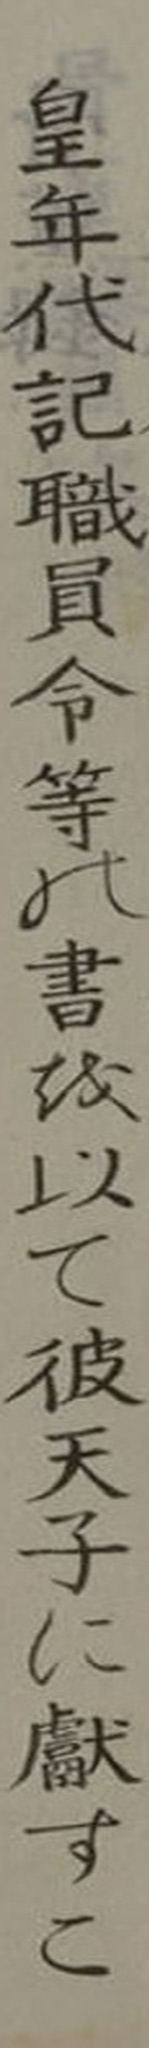皇年代記職員令等の書を以て彼天子に獻すこ
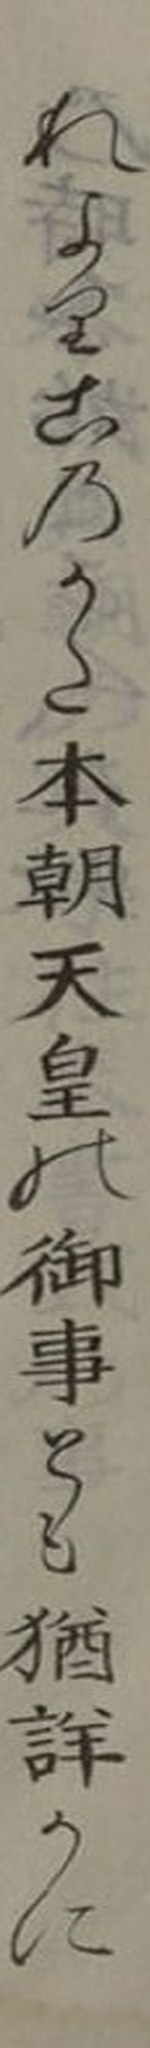れよりこのかた本朝天皇の御事とも猶詳かに
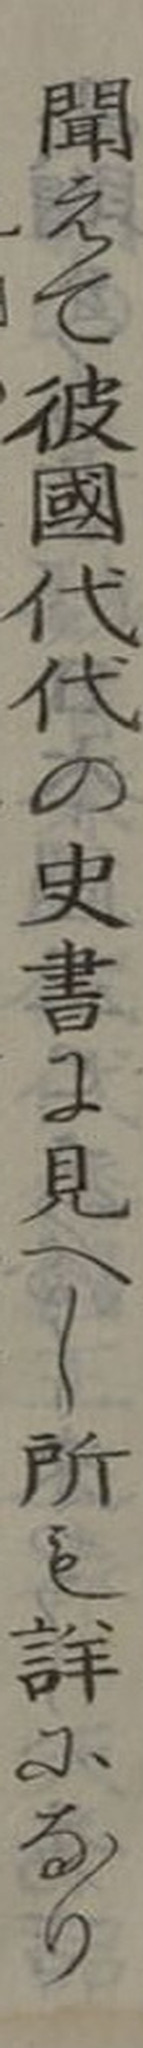聞えて彼國代代の史書に見へし所も詳になり
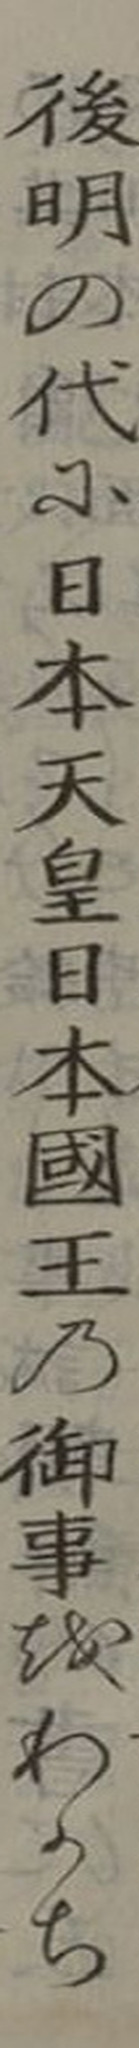後明の代に日本天皇日本國王の御事をわかち
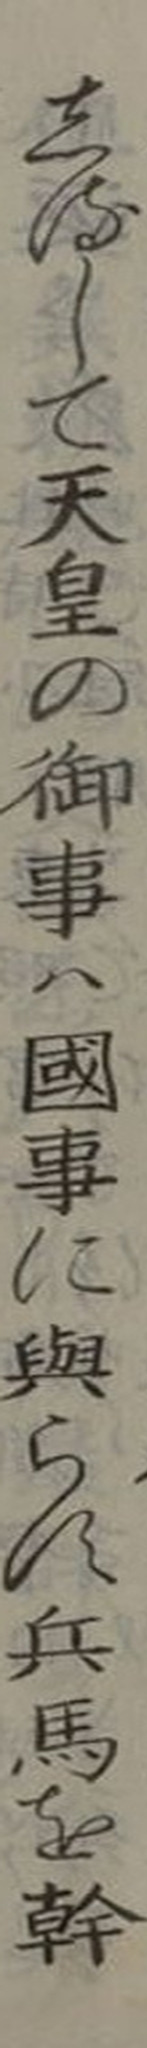しるして天皇の御事ハ國事に與らす兵馬を幹
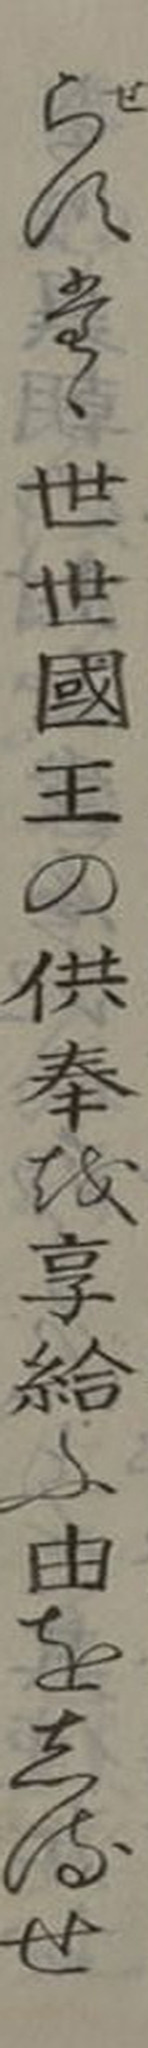らすたゝ世世國王の供奉を享給ふ由をしるせ
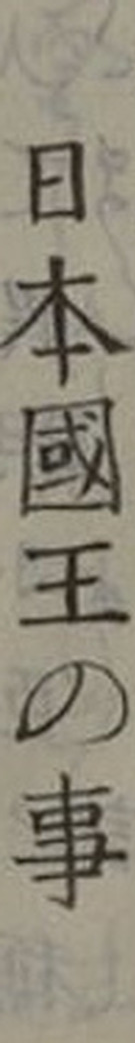日本國王の事
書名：骨董録
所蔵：University of the Ryukyus Library
